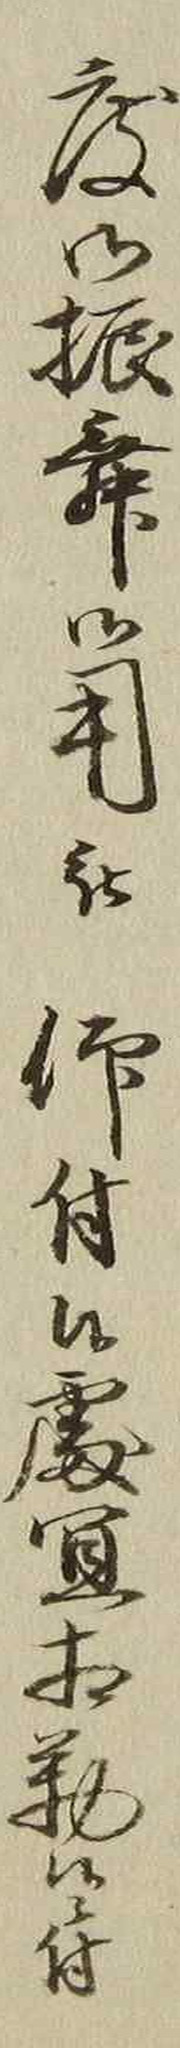度御振舞御用被仰付候處宣相勤候二付
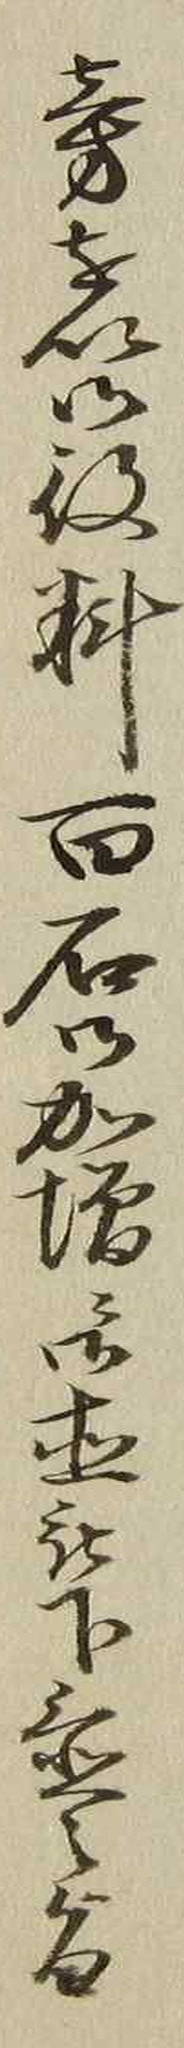旁を以御役料百石御加増二御直被下置之旨
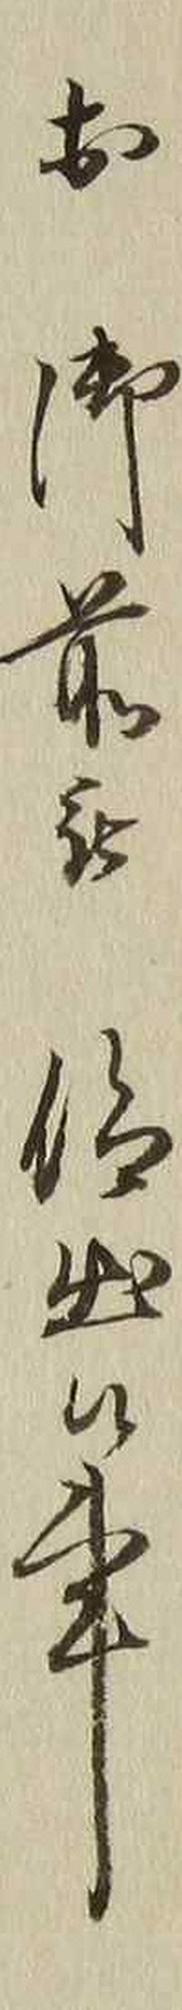お御前被仰付候事
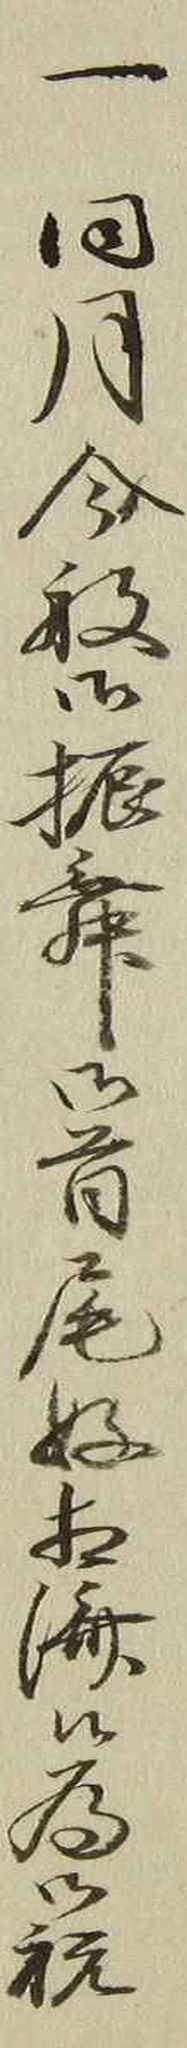一同月今般御振舞御首尾好相済候為御祝
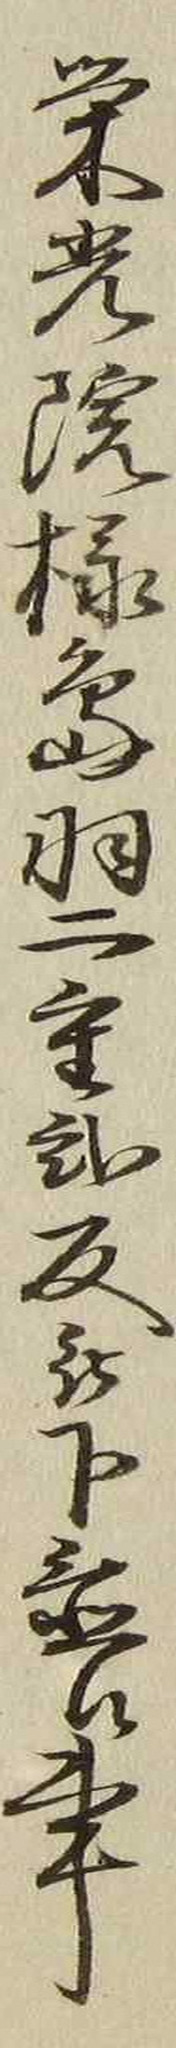栄光院様島羽二重弐反被下置候事
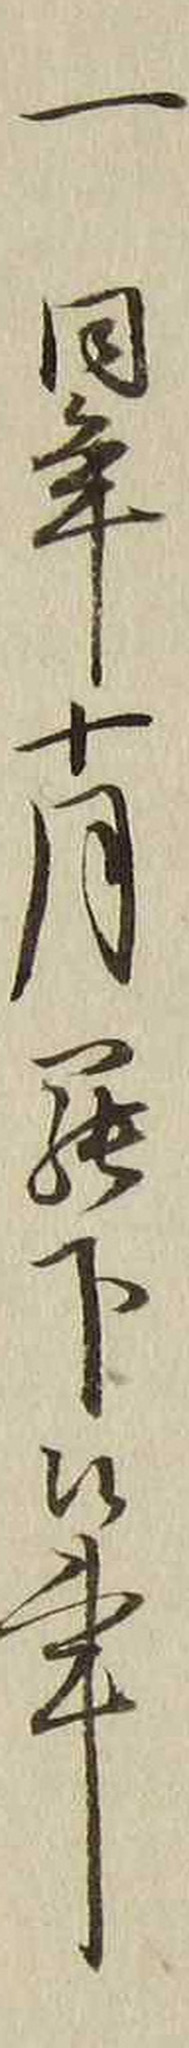一同年十月罷下候事
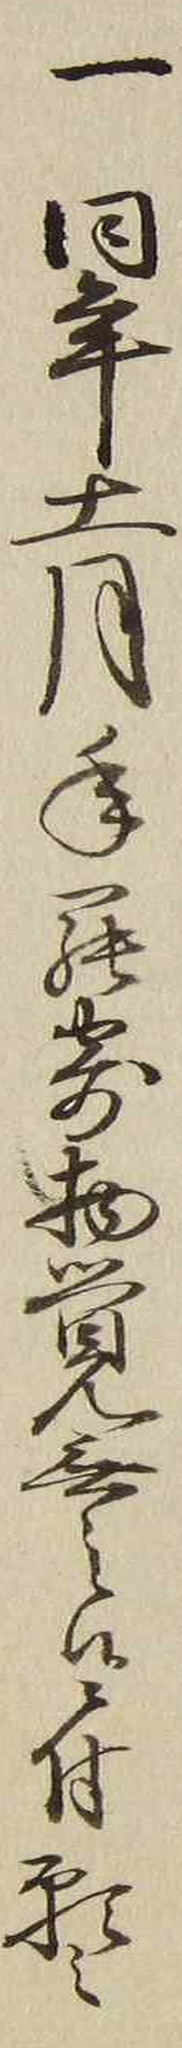一同年十一月年罷寄物覚無之候二付願之
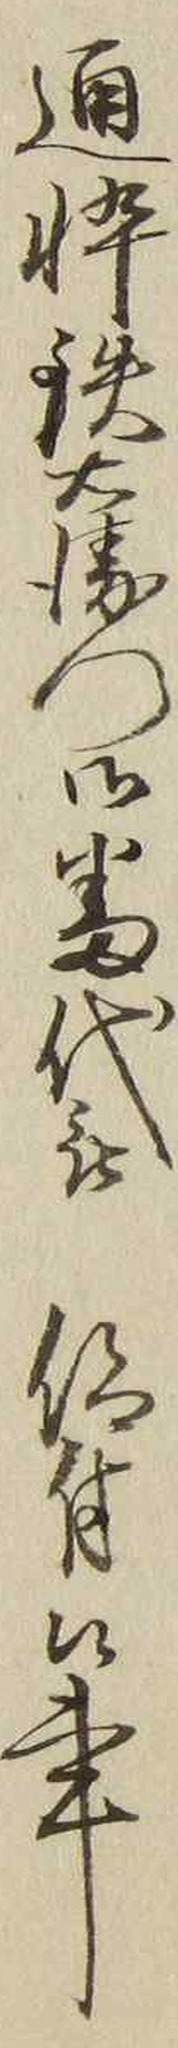通忰鉄右衛門御番代被仰付候事
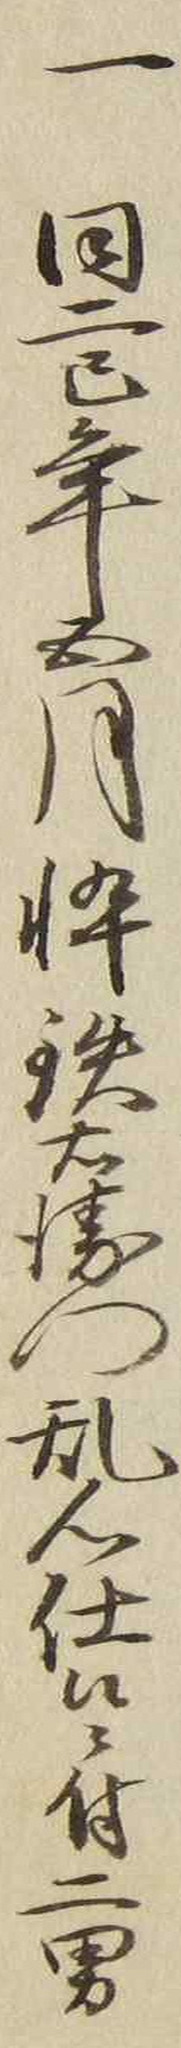一同ニ巳年五月忰鉄右衛門乱心仕候ニ付二男

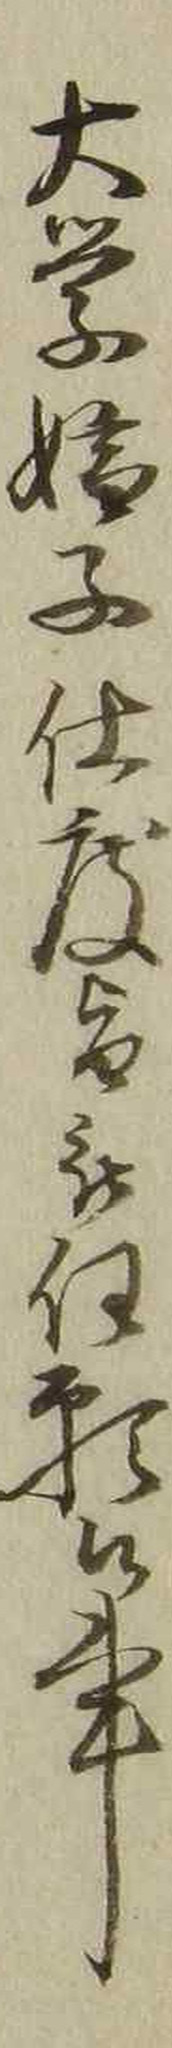大学嫡子仕度旨被伺願候事
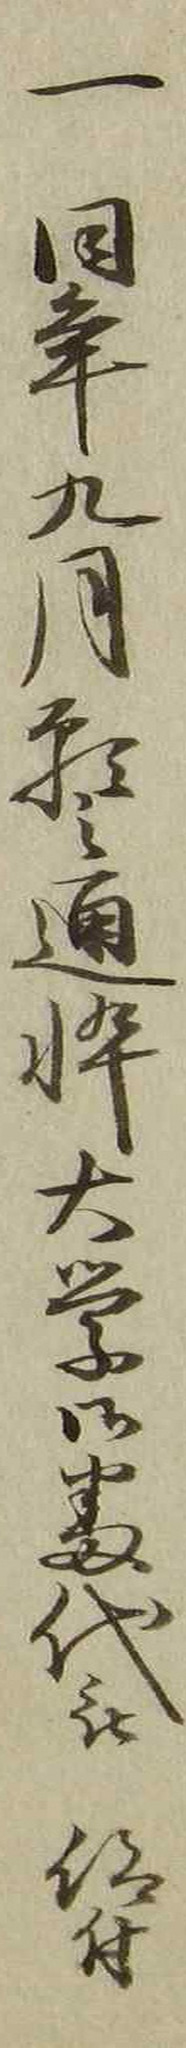一同年九月願之通忰大学御番代被仰付
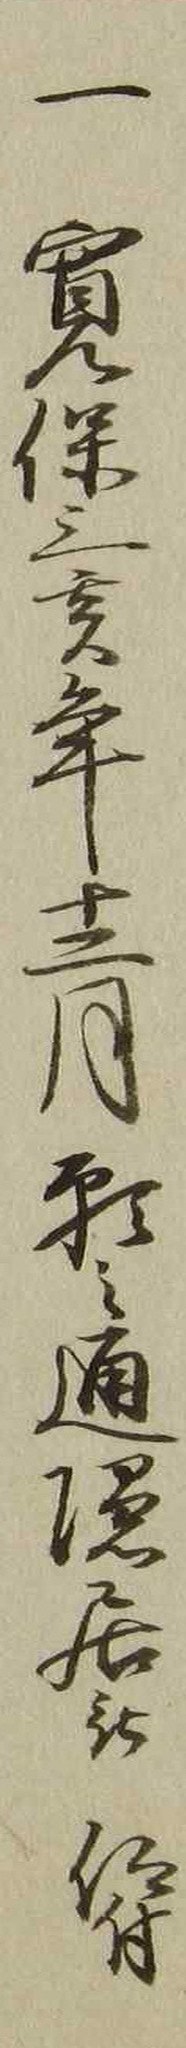一寛保三亥年十二月願之通隠居被仰付
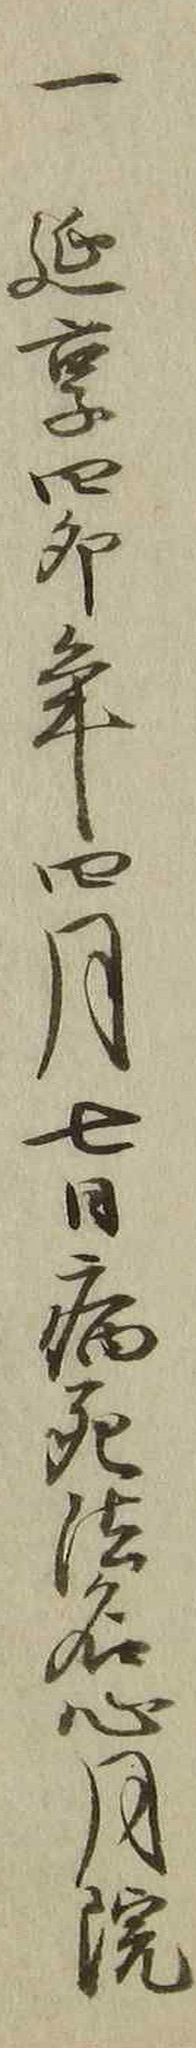一延享四夘年四月七日病死法名心月院
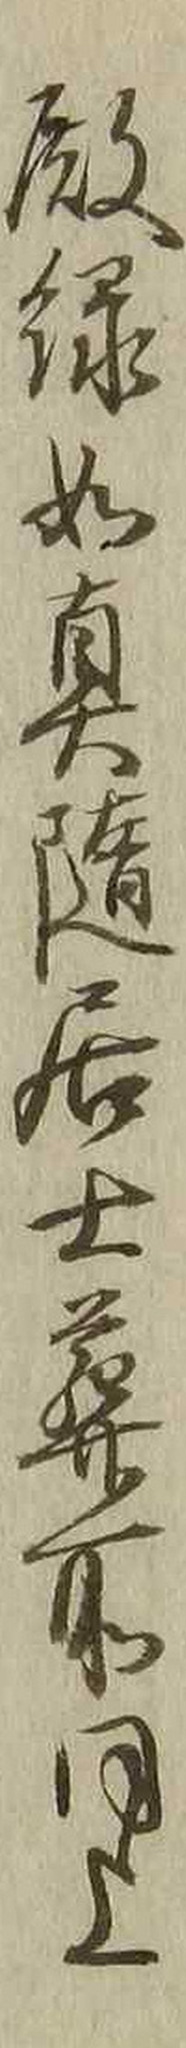殿緑如真随居士葬所同上
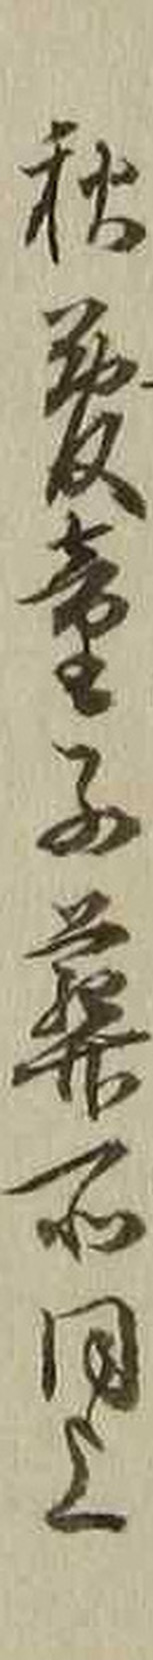秋夢童子葬所同上
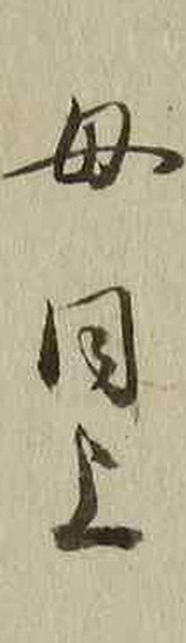母同上
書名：諸士系譜　巻之114　か之部22
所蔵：会津若松市立会津図書館
